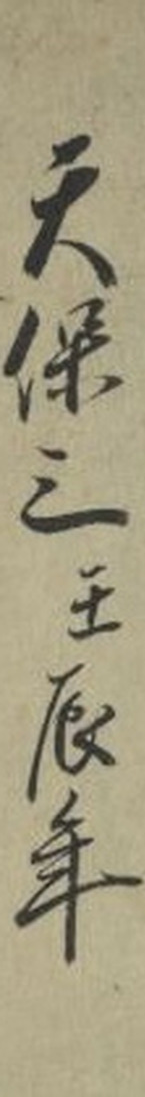天保三壬辰年
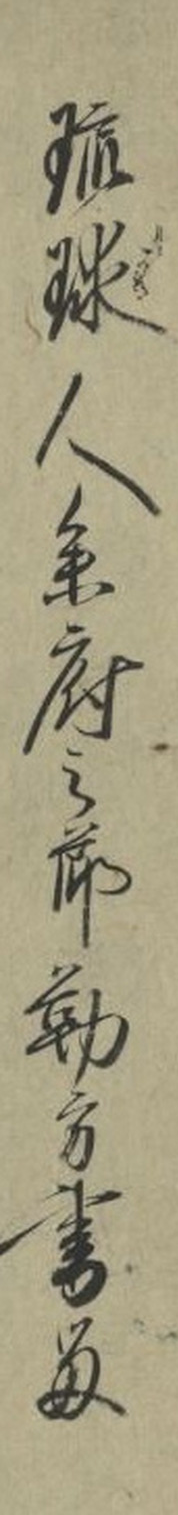琉球人参府之節勤方書留
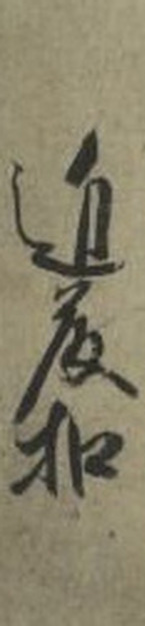近藤扣

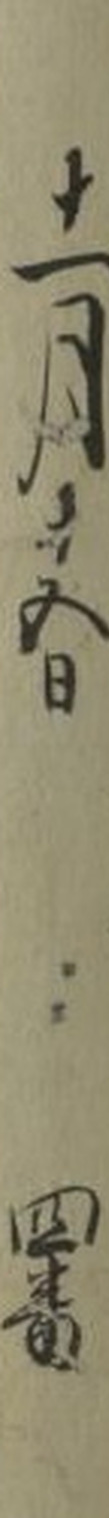十一月十五日四番
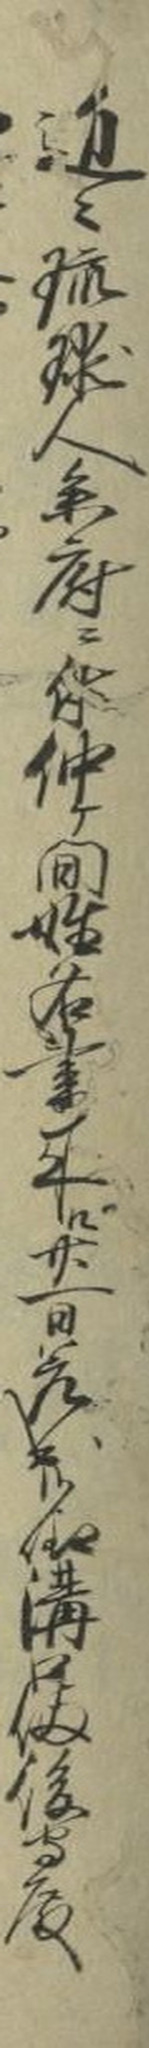近々琉球人参府に付仲か間姓名書来る廿一日差出候様溝口備後守殿
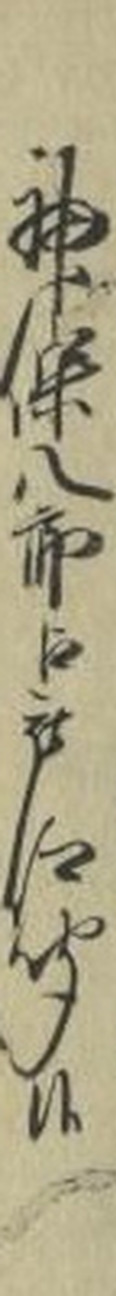神保八郎え被仰聞候
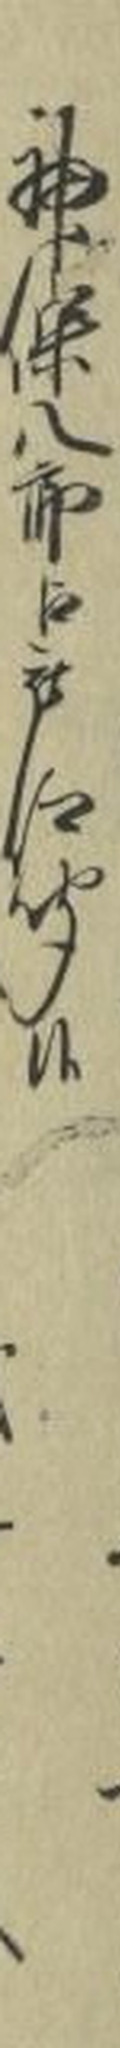神保八郎え被仰聞候
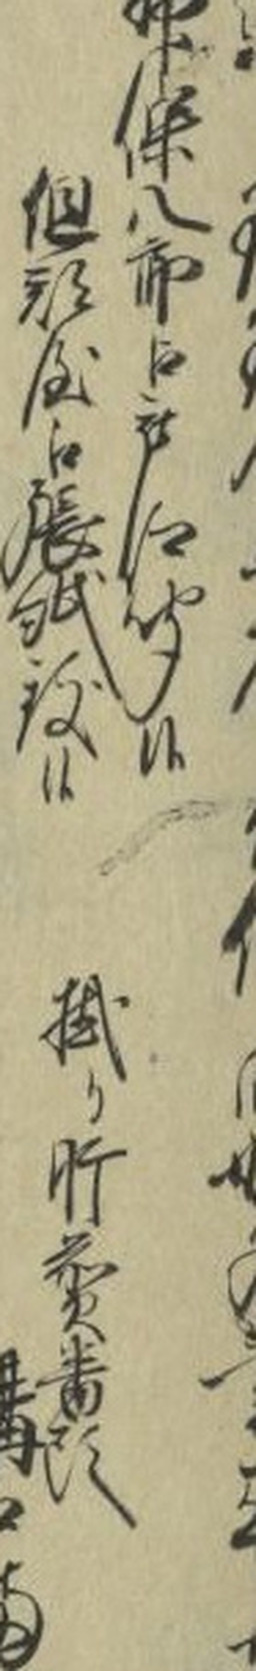但部屋え張紙致候掛り肝煎番頭
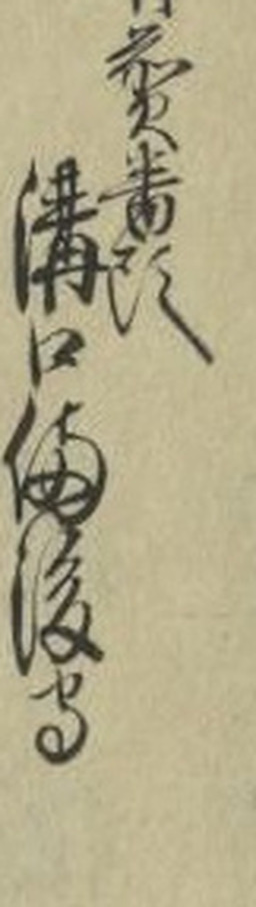溝口備後守
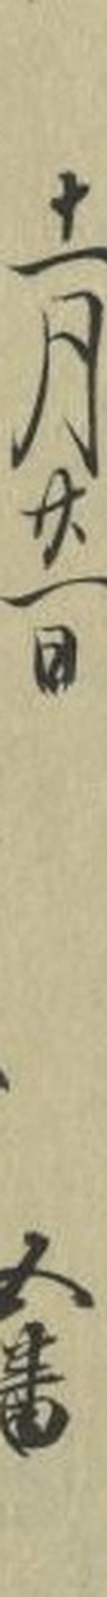十一月廿一日五番
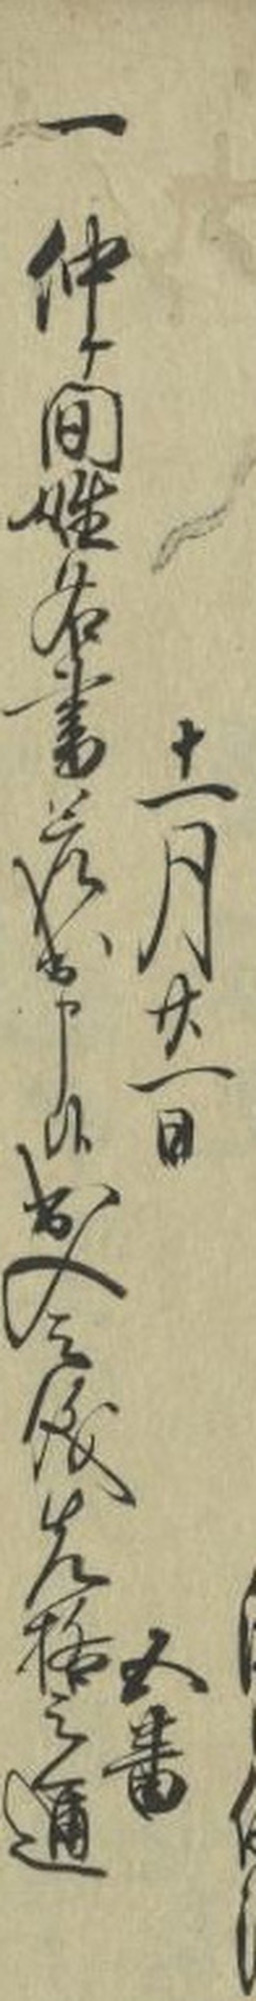一仲か間姓名書差出申候出入之儀先格之通
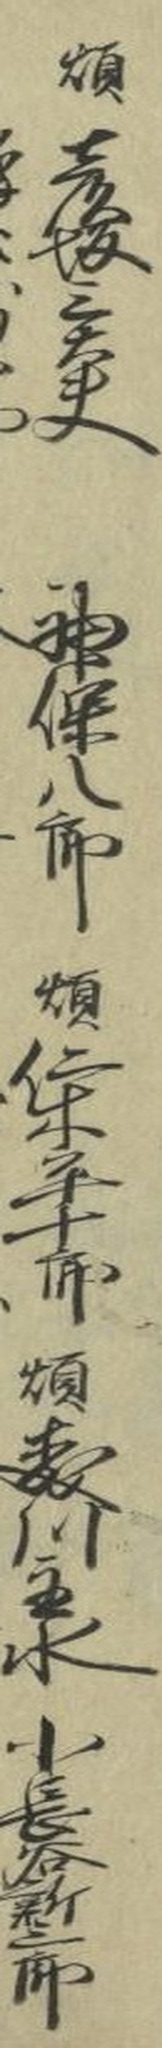煩彦坂三大夫神保八郎煩仁木平十郎煩森川主水小長谷新三郎
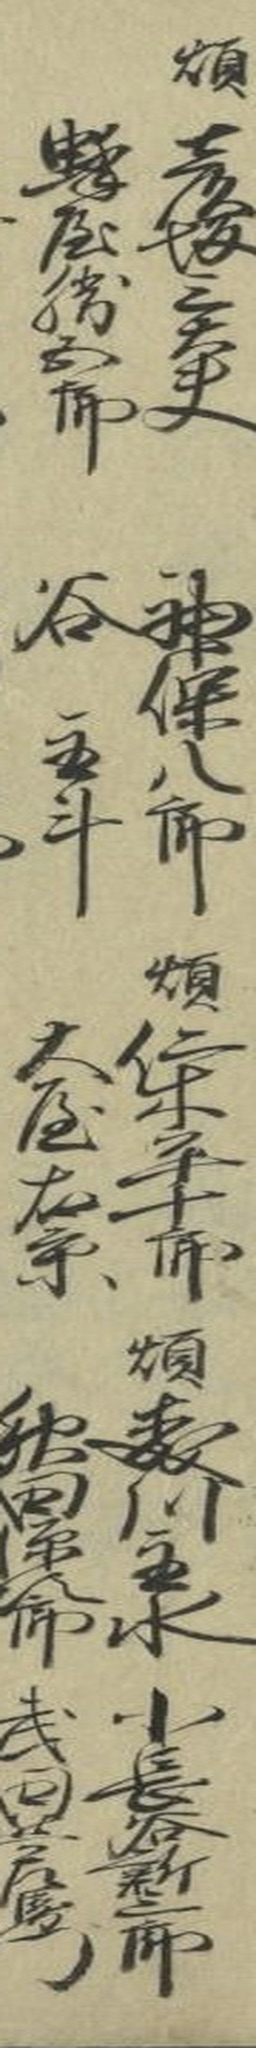蜂屋勝五郎谷主計大屋右京秋田源次郎武田与左衛門
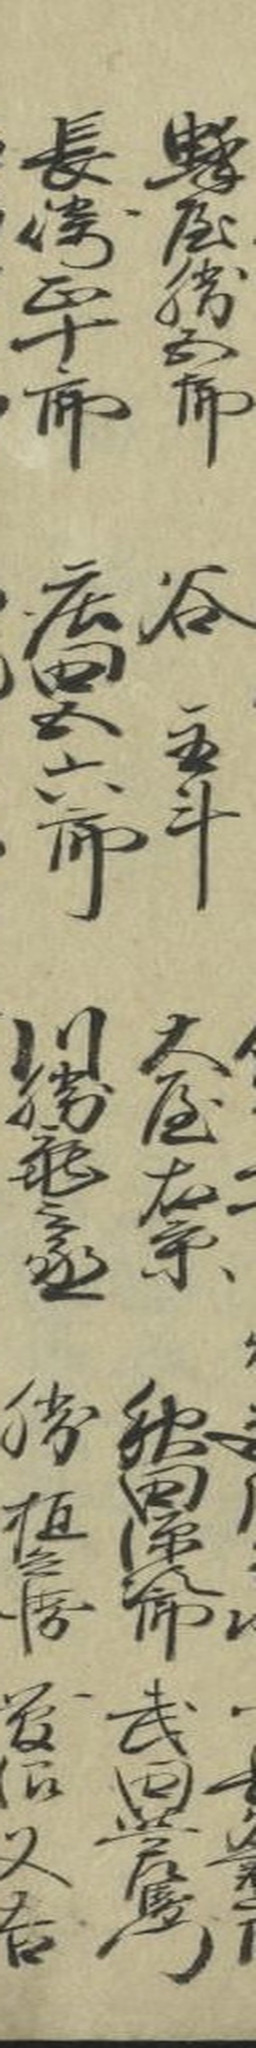長崎正十郎庄田五六郎川勝亀之丞勝恒兵衛菅沼又吉
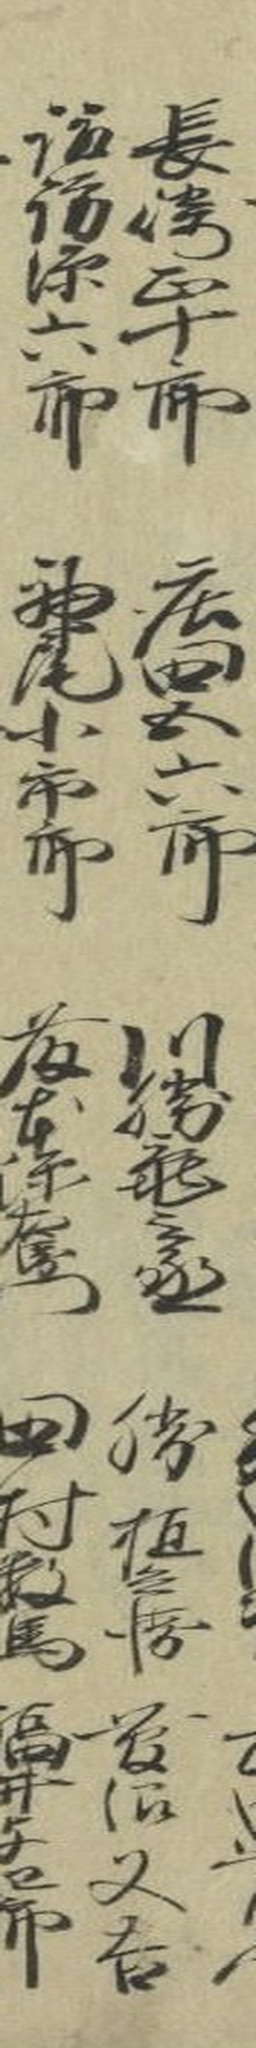諏訪源六郎神尾小市郎藤本源右衛門田村数馬福井与四郎
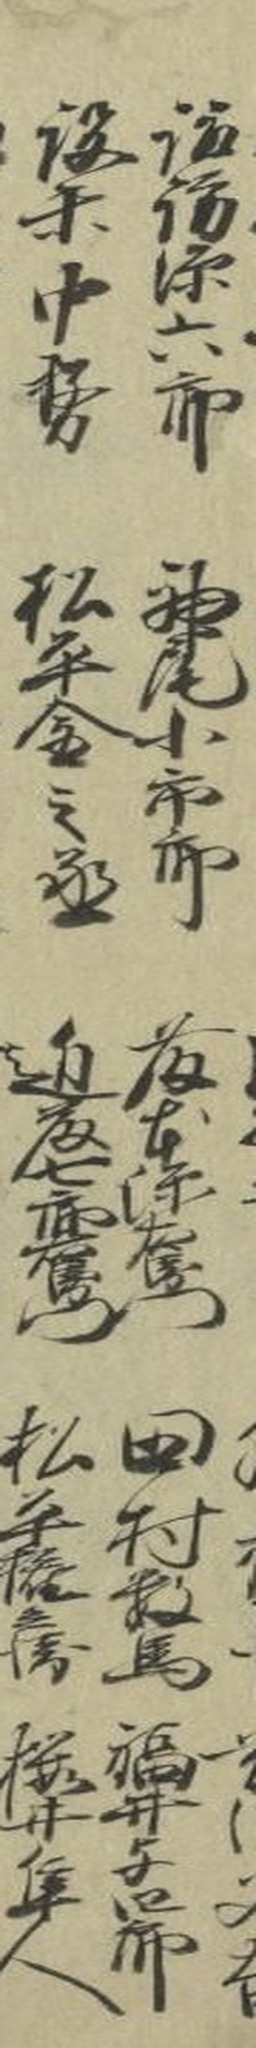設楽中務松平金之丞近藤七郎右衛門松平権兵衛桜井隼人
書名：天保三壬辰年琉球人参府之節勤方書留
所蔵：University of the Ryukyus Library
